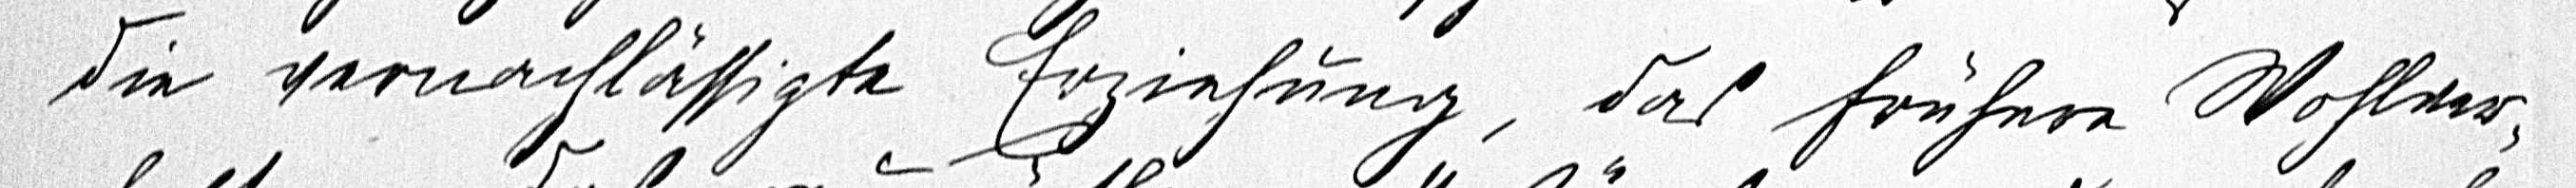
die vernachlässigte Erziehung, das frühere Wohlver¬
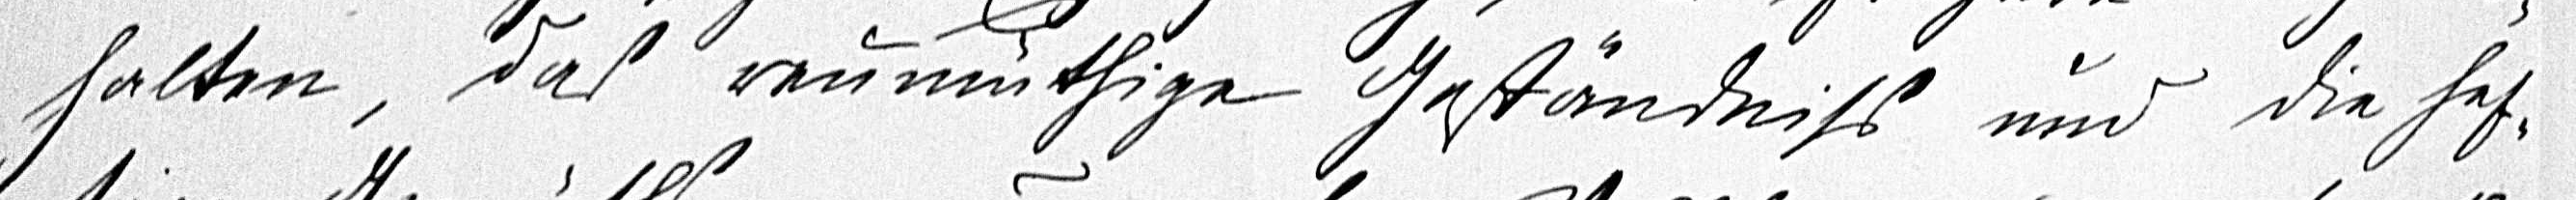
halten, das reumüthige Geständniß und die hef¬
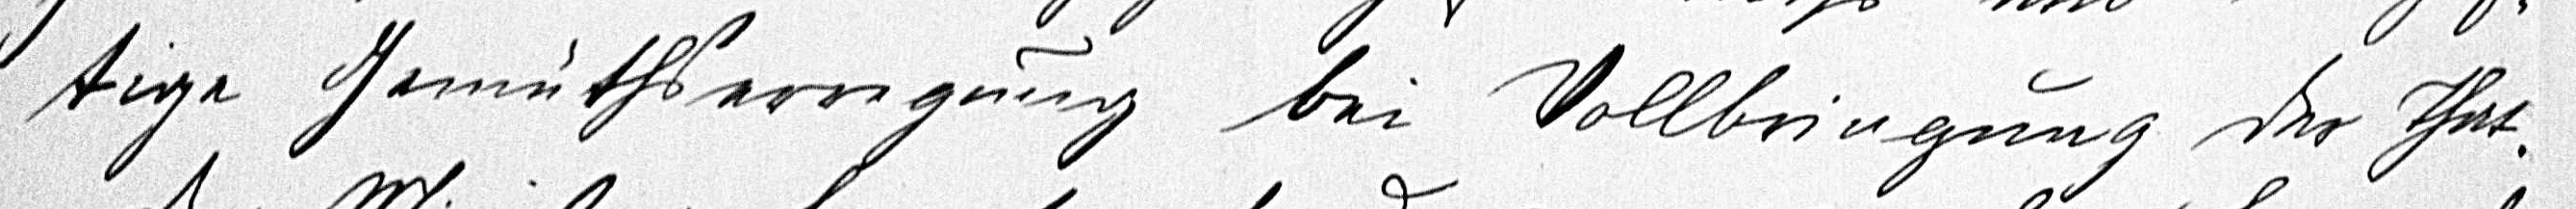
tige Gemüthserregung bei Vollbringung der That
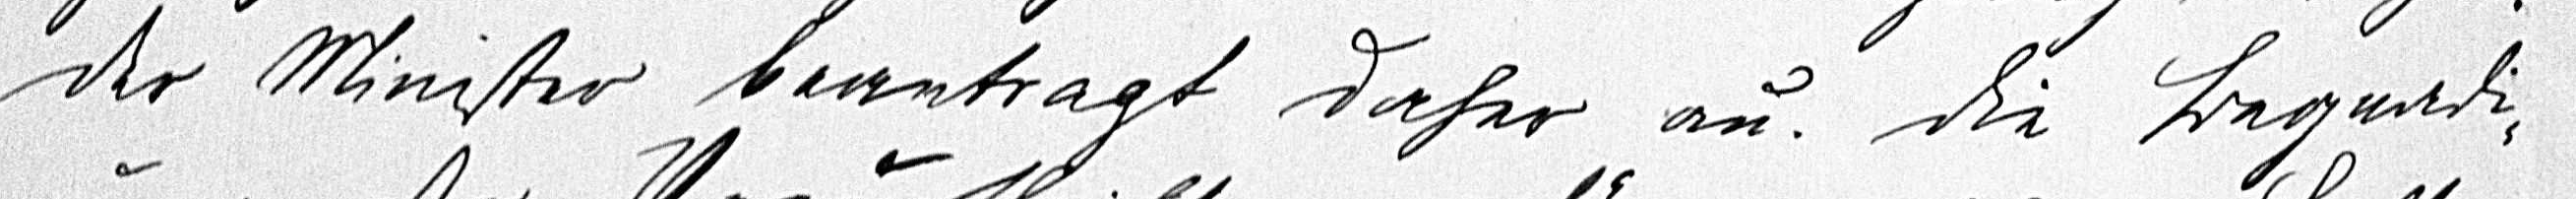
der Minister beantrag daher au. die Begnadi¬
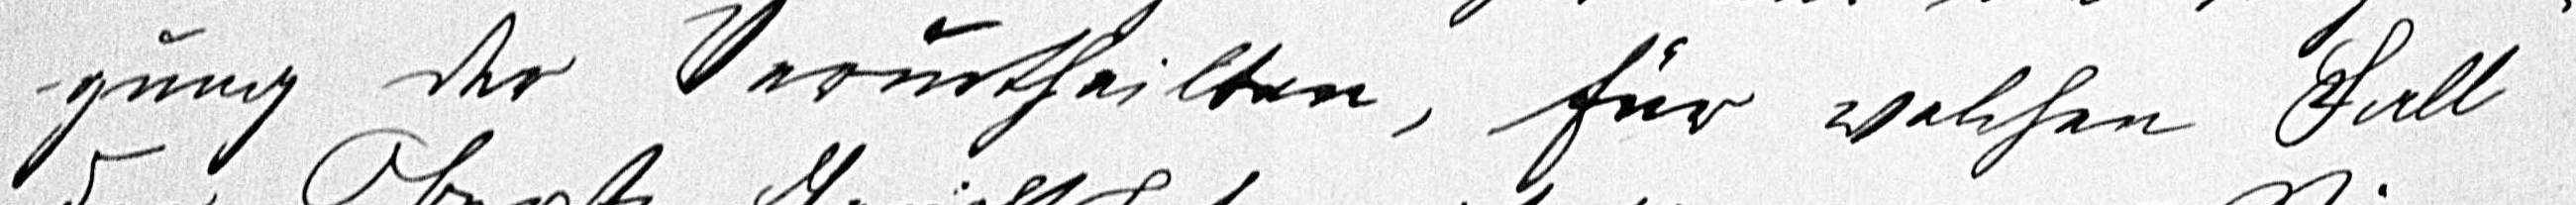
gung der Verurtheilten, für welchen Fall
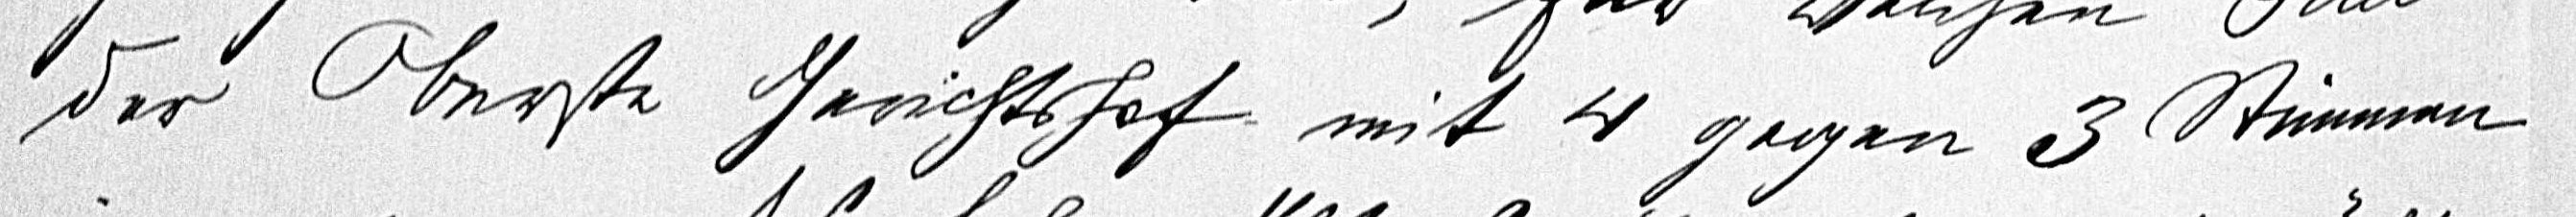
der Oberstel Gerichtshof mit 4 gegen 3 Stimmen
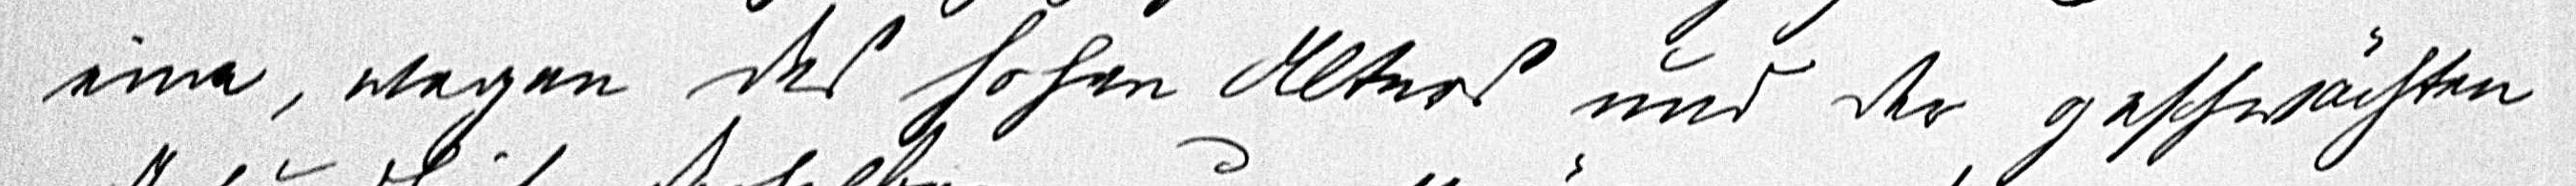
eine, wegen des hohen Alters und der geschwächten
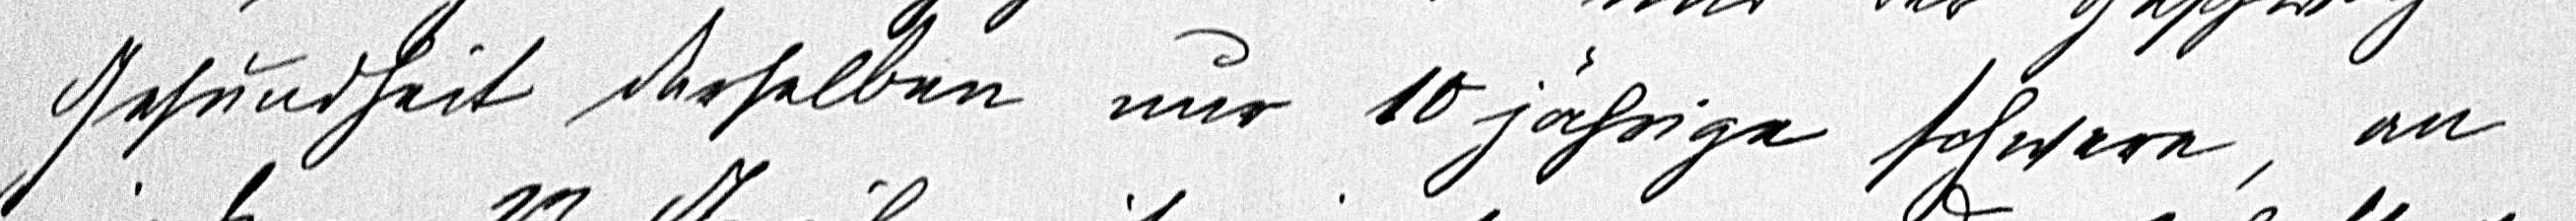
Gesundheit derselben nur 10jährige schwere, an
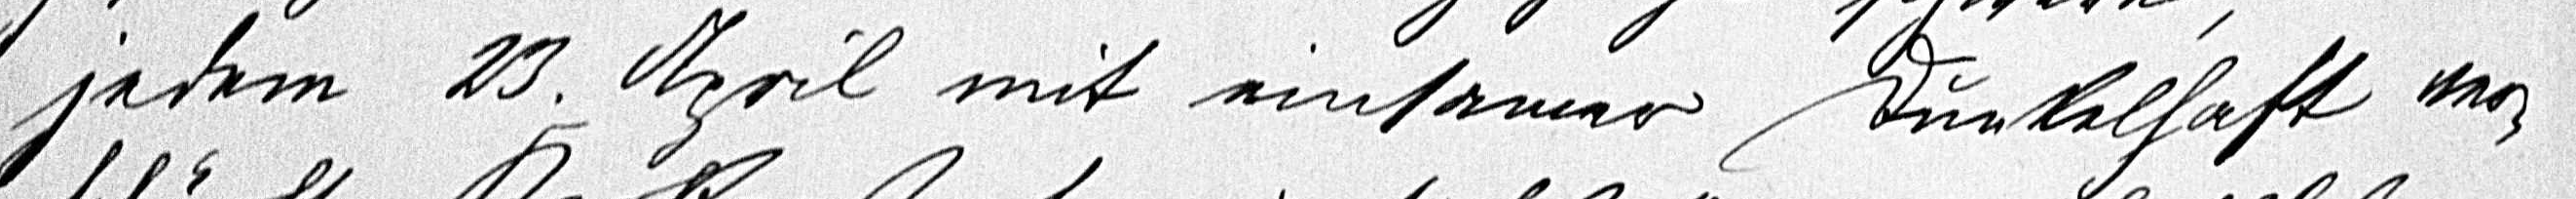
jedem 23. April mit einsamer Dunkelhaft ver¬
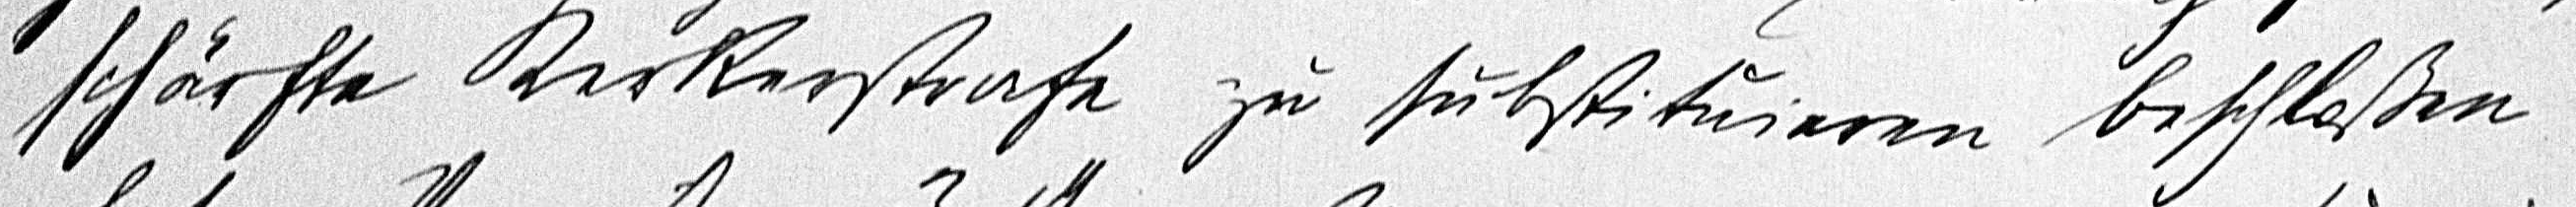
schärfte Kerkerstrafe zu substituieren beschloßen
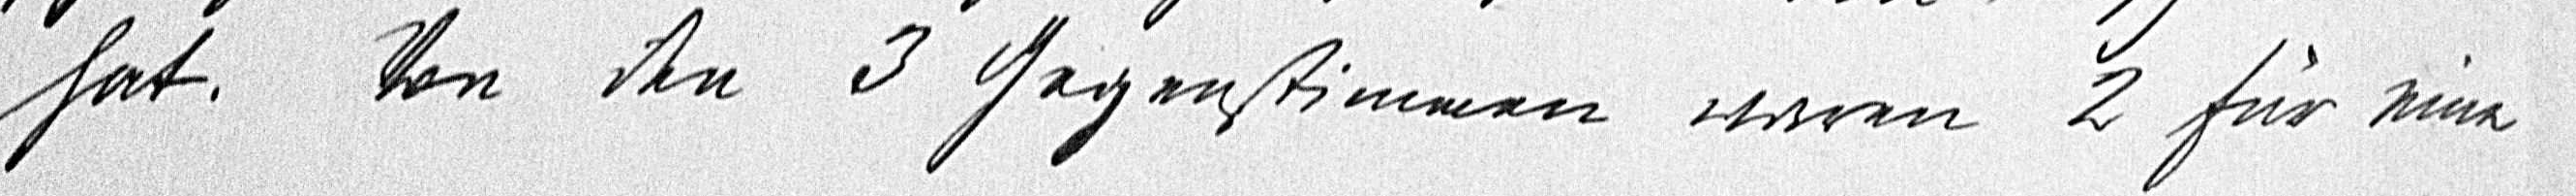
hat. Von den 3 Gegenstimmen waren 2 für eine
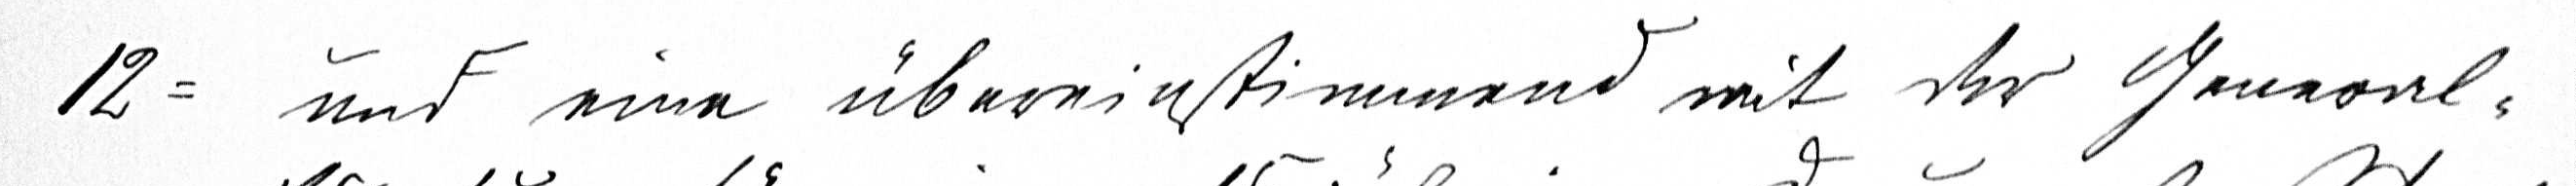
12 und eine übereinstimmend mit der General¬
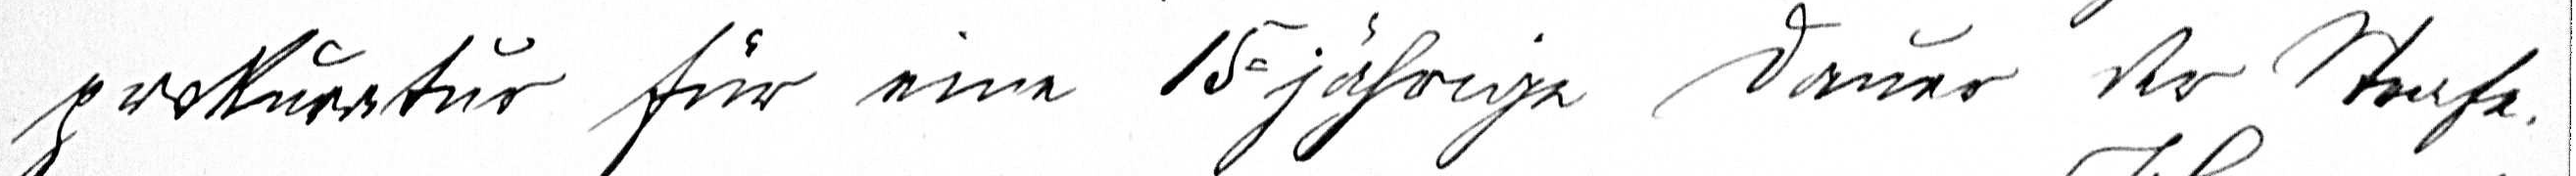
prokuratur für eine 15 jährige Dauer der Strafe.
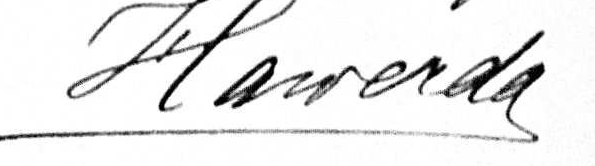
Hawerda
